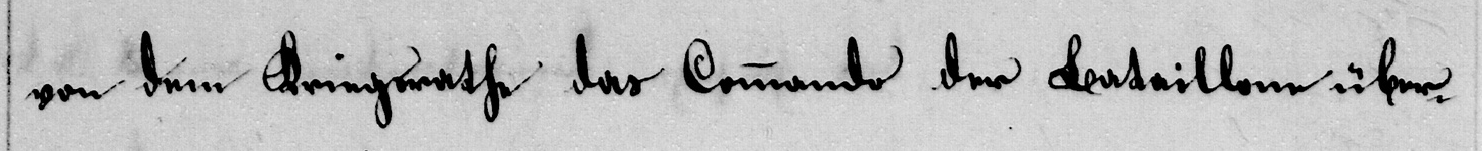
von dem Kriegsrathe das Commando der Bataillone über¬
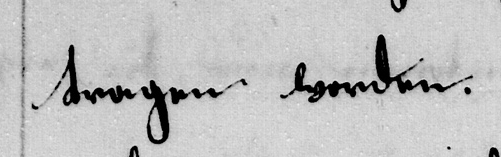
tragen worden.
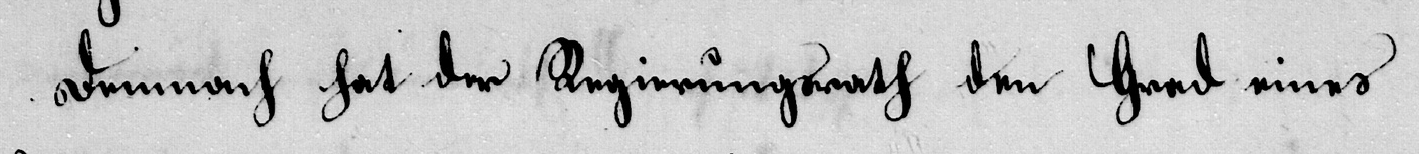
Demnach hat der Regierungsrath den Grad eines
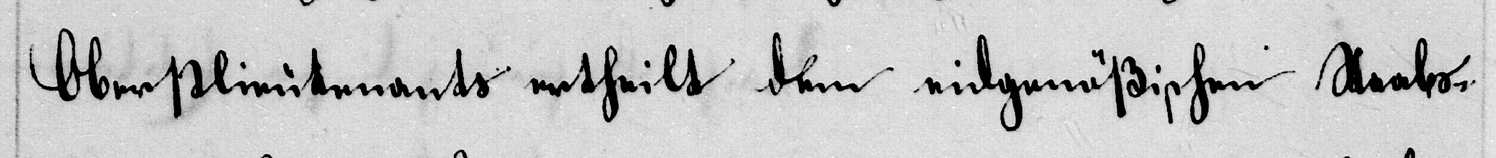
Oberstlieutenants ertheilt dem eidgenößischen Staabs¬
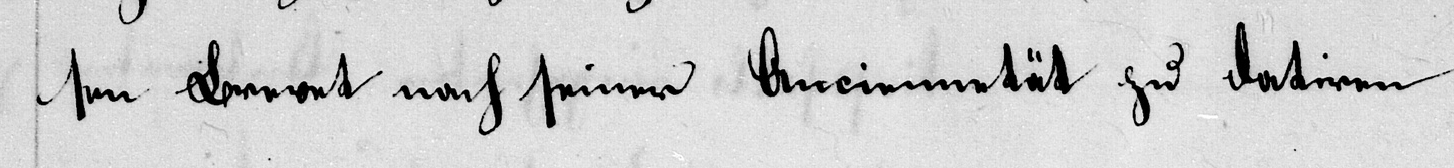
en Brevet nach seiner Anciennetät zu datiren
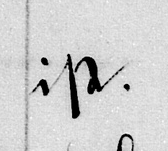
ist.
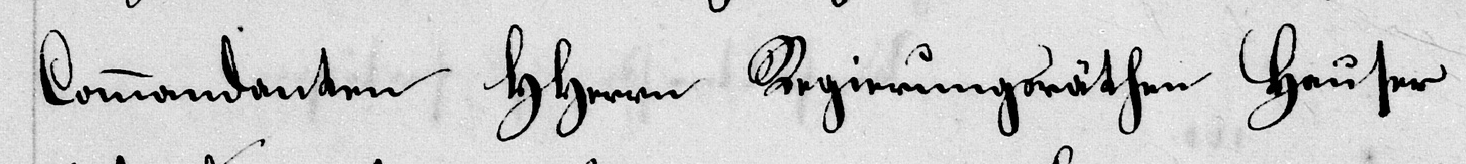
ommandanten HHerren Regierungsräthen Hauser
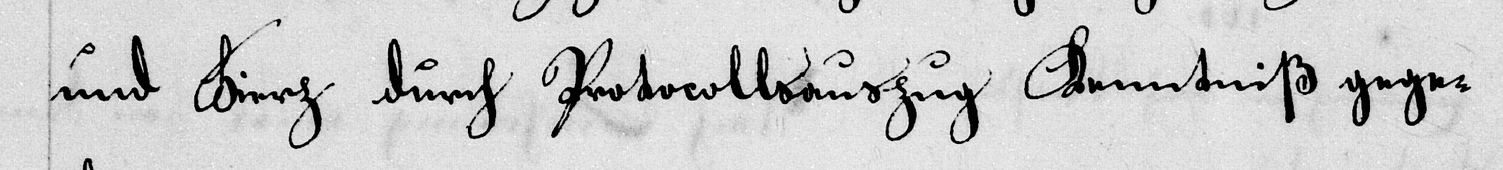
und Fierz durch Protocollsauszug Kenntniß gege¬
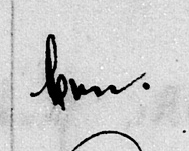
ben.
